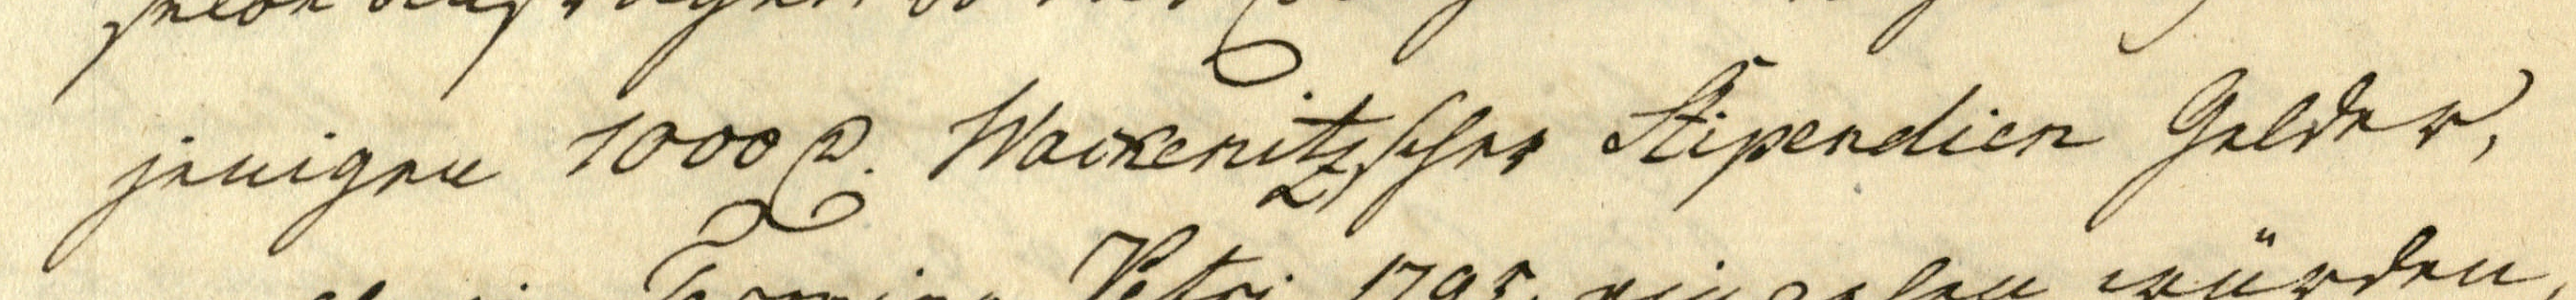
jenigen 1000 l. Wackenitzscher Stipendien Gelder,
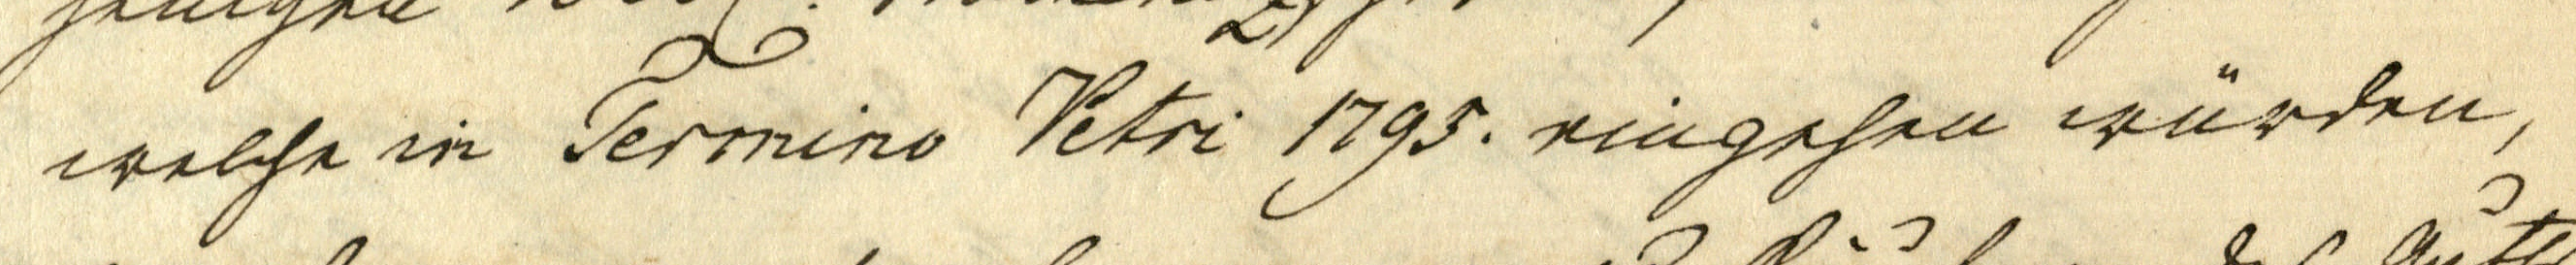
welche in Termino Petri 1795. eingehen würden,
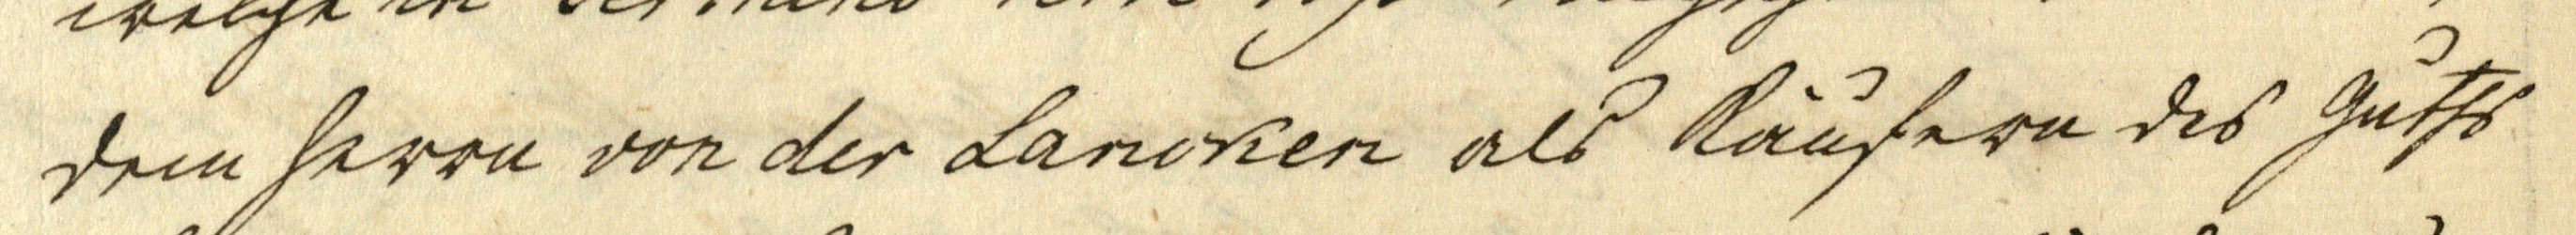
dem Herrn von der Lancken als Käufern des Guths
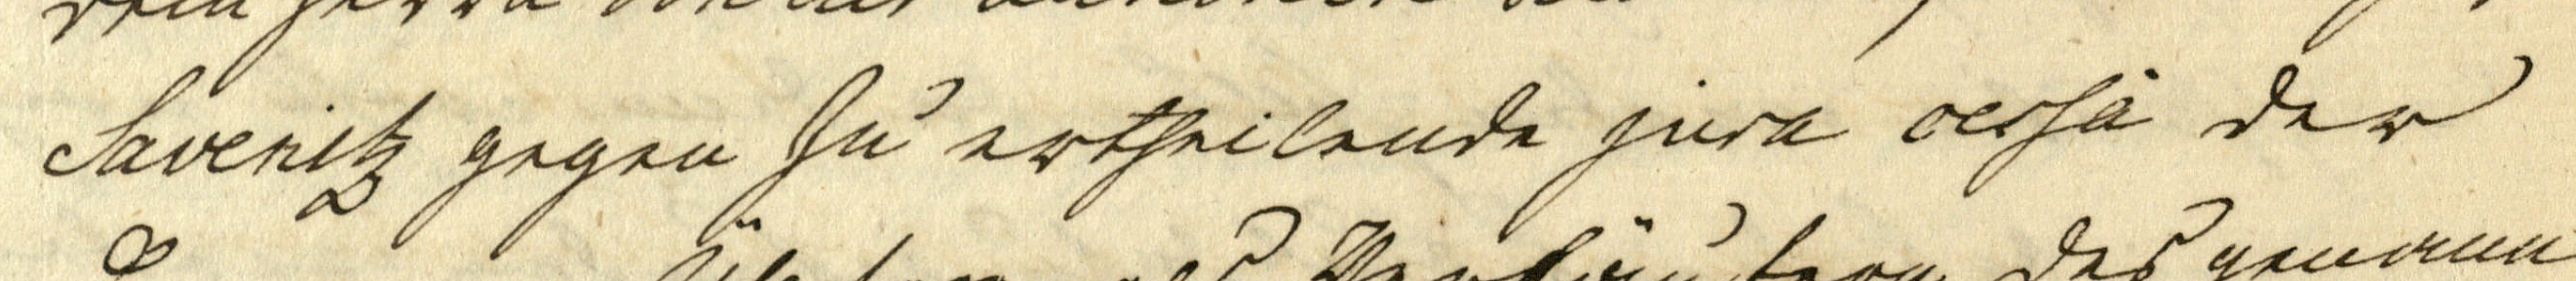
Savenitz gegen zu ertheilende jura cessa der
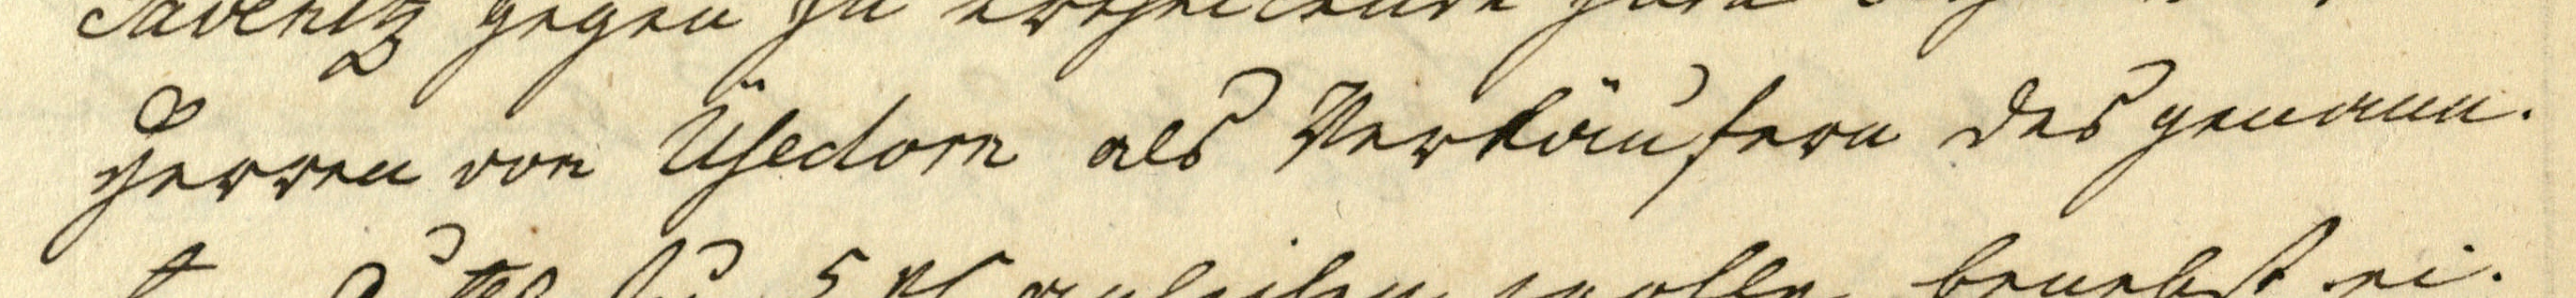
Herren von Usedom als Verkäufern des genann-
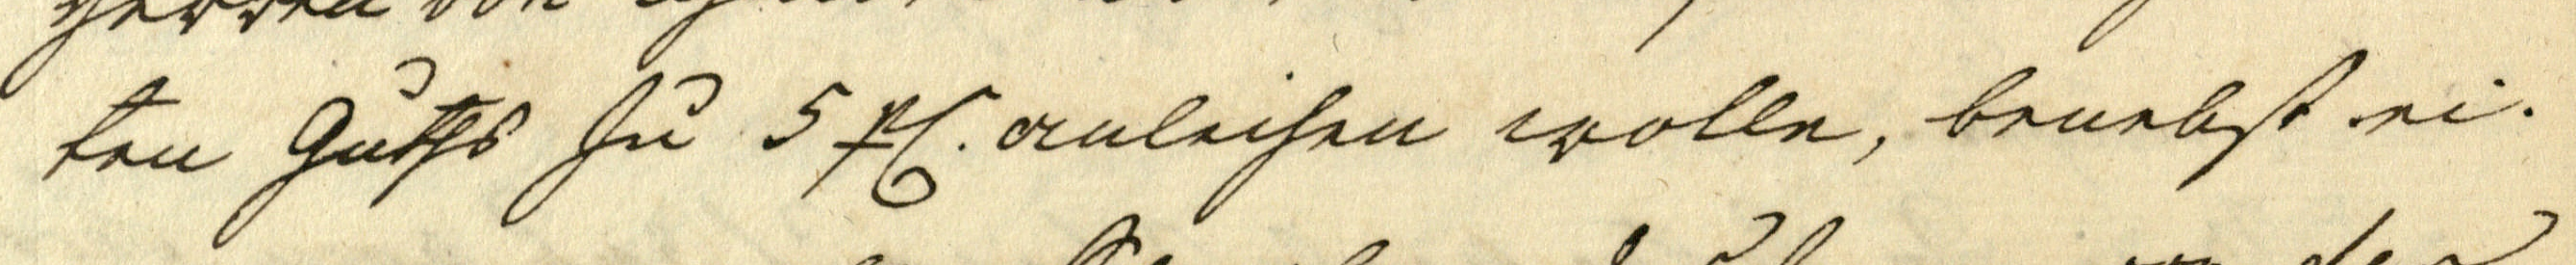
ten Guths zu 5 pl. anleihen wolle, benebst ei¬
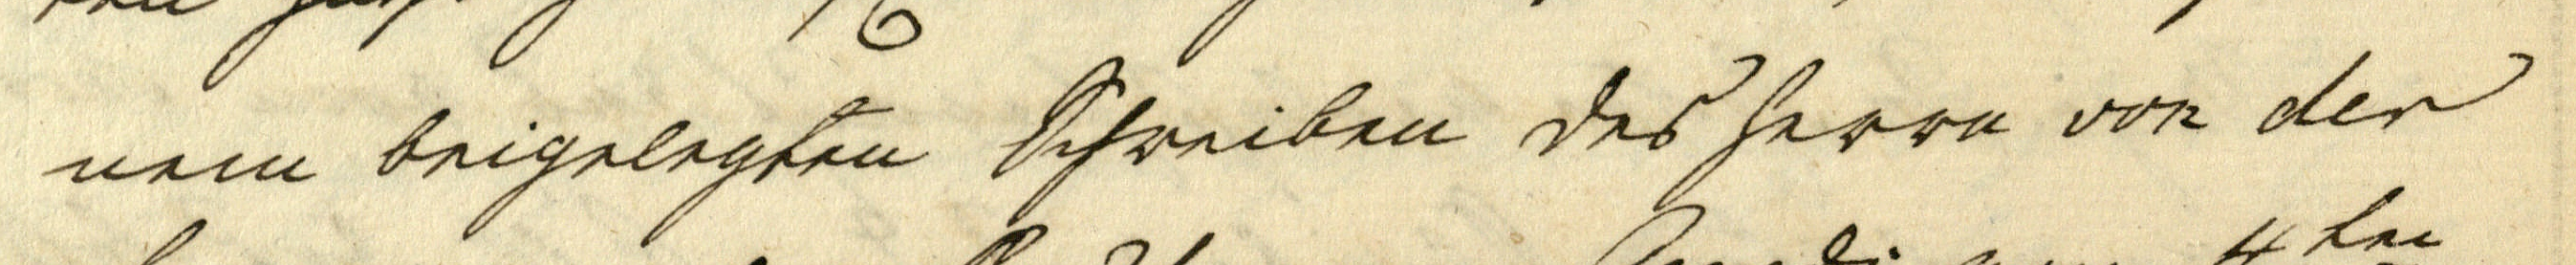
nem beigelegten Schreiben des Herrn von der
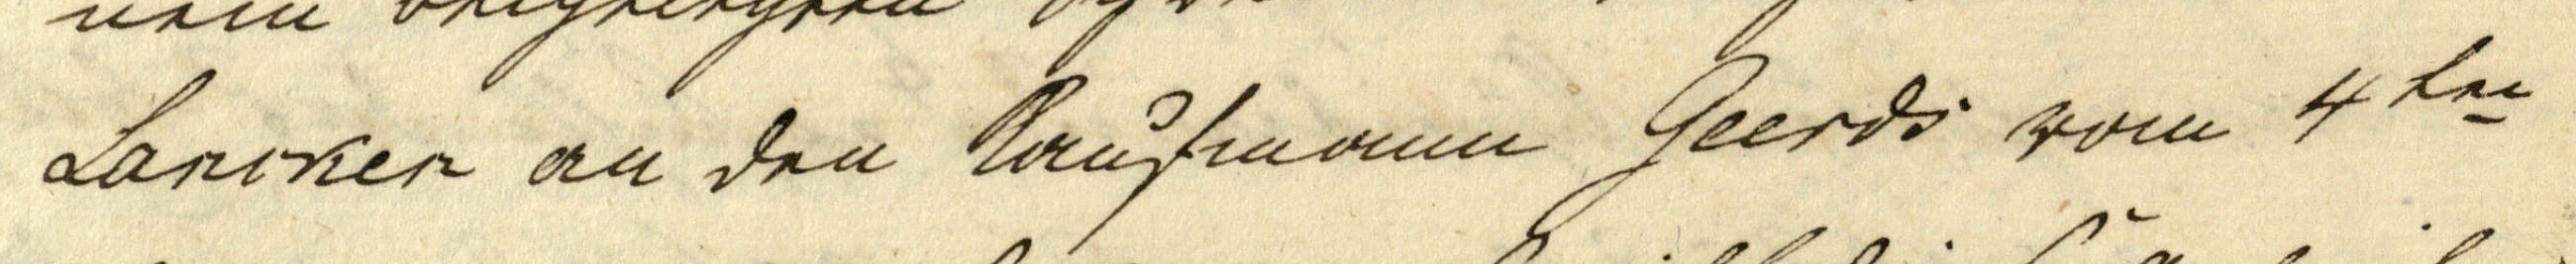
Lancken an den Kaufmann Geerds vom 4 ten
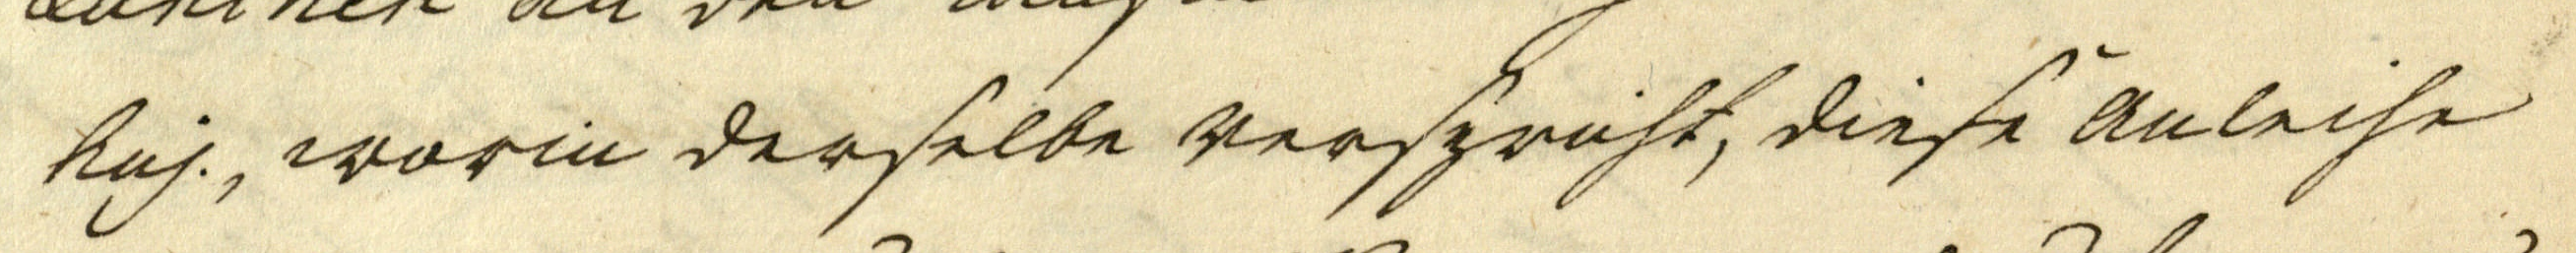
huj., worin derselbe verspricht, diese Anleihe
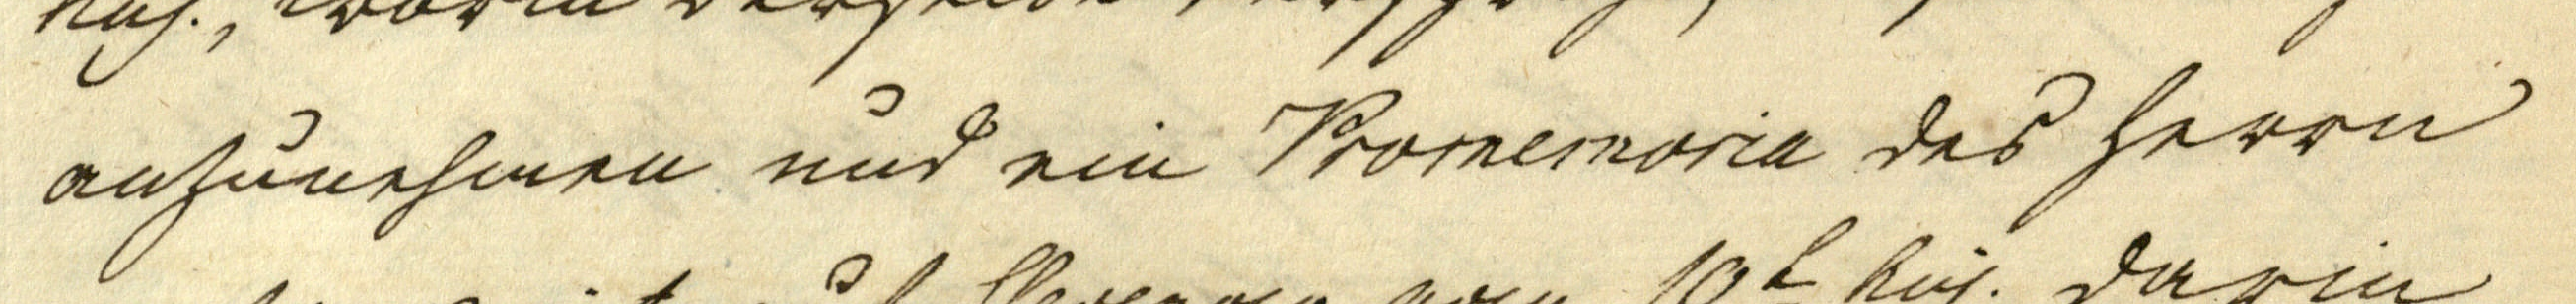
anzunehmen und ein Promemoria des Herrn
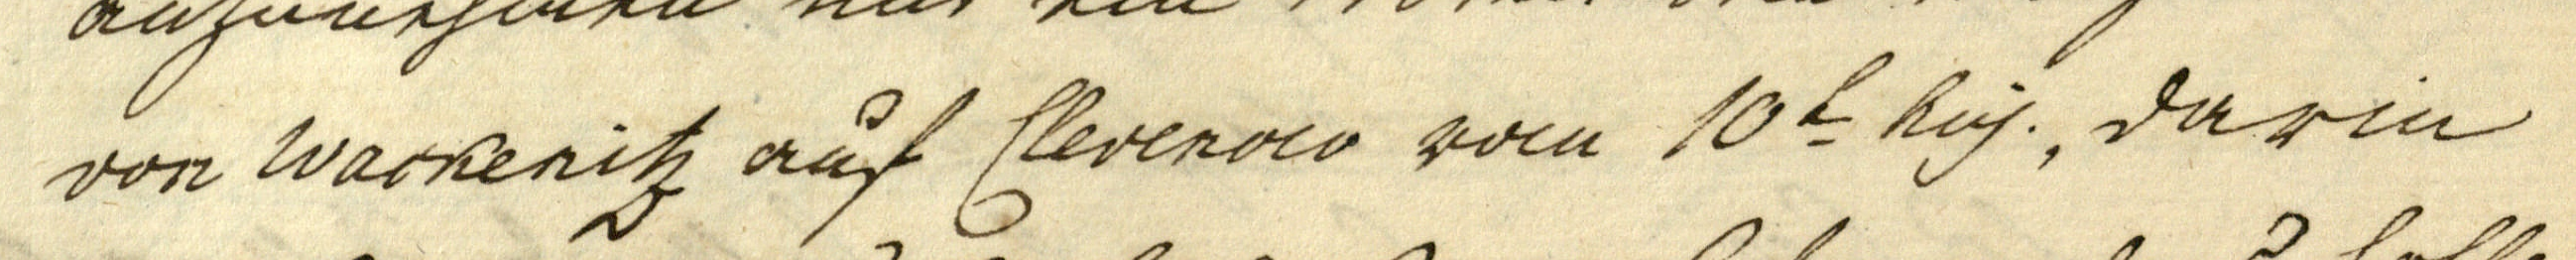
von Wackenitz auf Clevenow vom 10 t. huj., darin
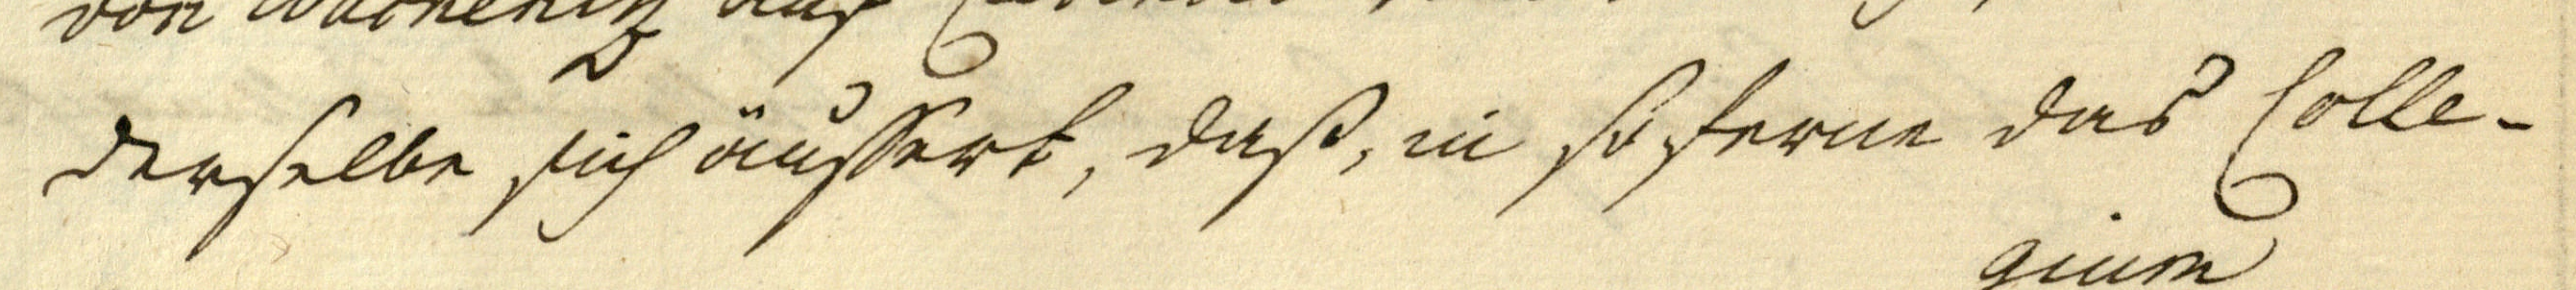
derselbe sich äussert, daß, in so ferne das Colle¬
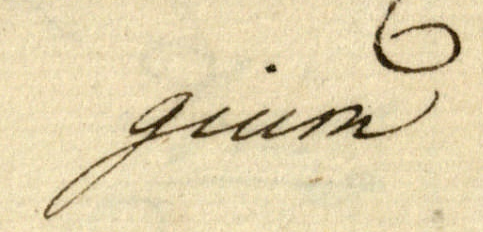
gium
